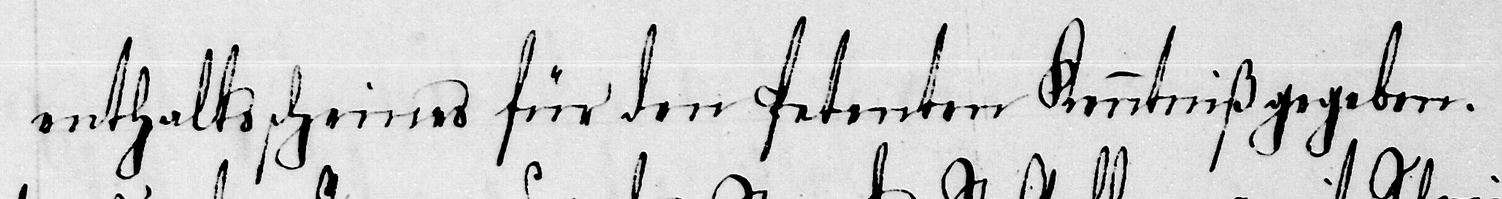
enthaltsscheines für den Petenten Kenntniß gegeben.
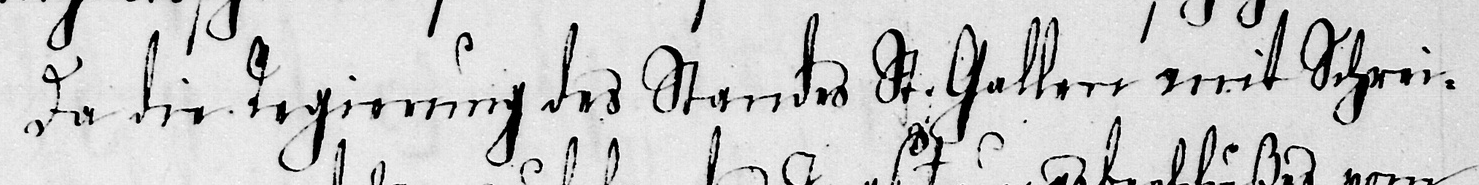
Da die Regierung des Standes St. Gallen mit Schrei¬
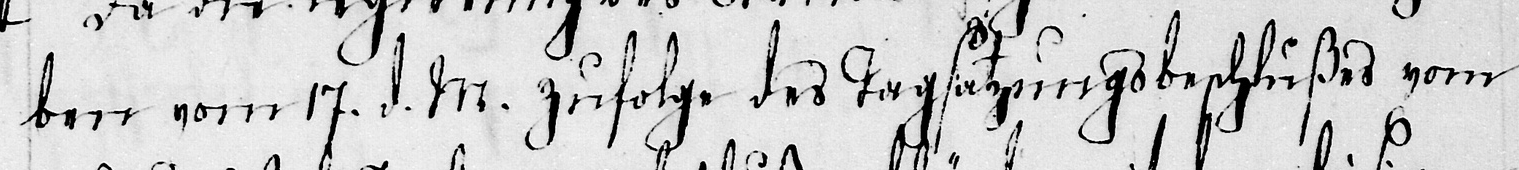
ben vom 17. d. M. zufolge des Tagsatzungsbeschlußes vom
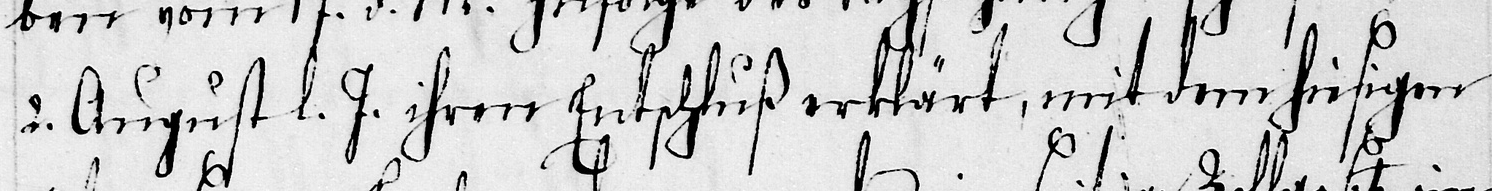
2. August l. J. ihren Entschluß erklärt, mit dem hiesigen
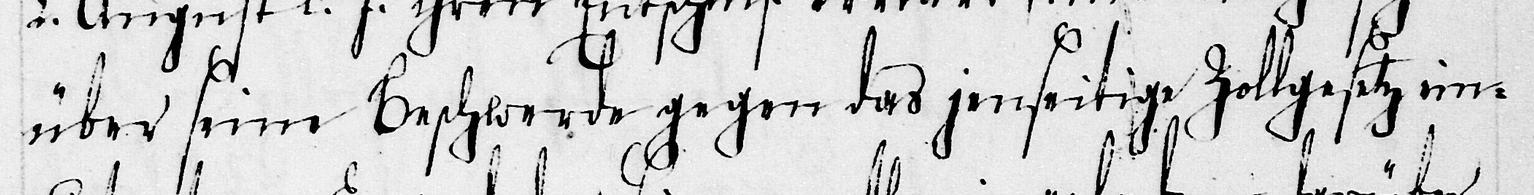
über seine Beschwerde gegen das jenseitige Zollgesetz ein¬
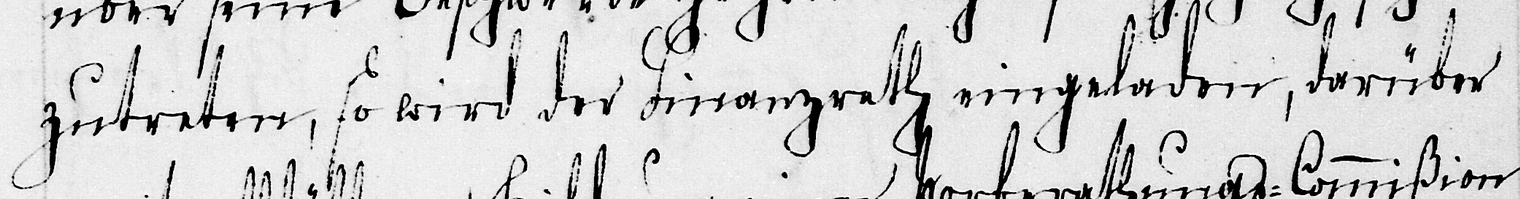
zutreten, so wird der Finanzrath eingeladen, darüber
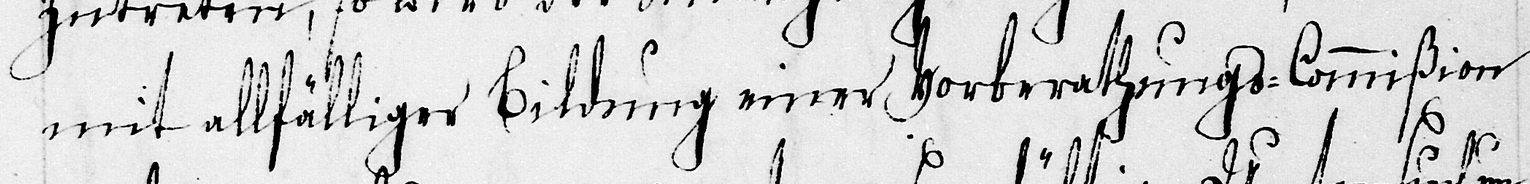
mit allfälliger Bildung einer Vorberathungs-Commißion
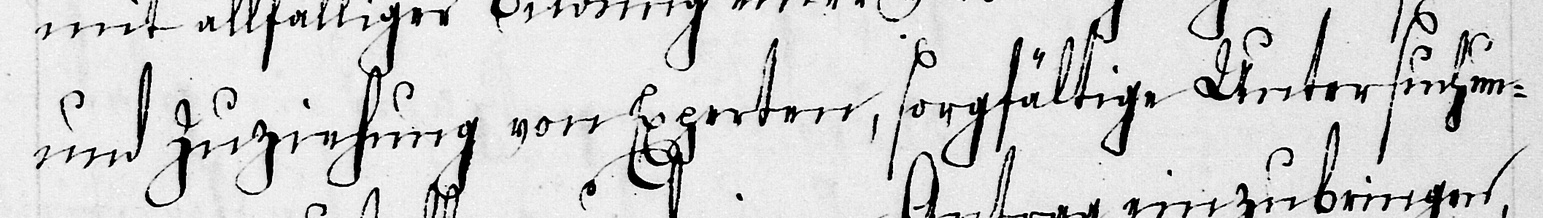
und Zuziehung von Experten, sorgfältige Untersuchun¬
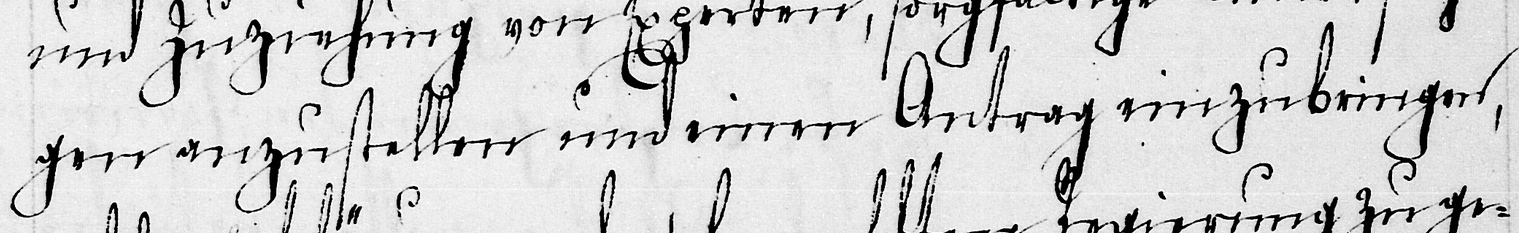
gen anzustellen und einen Antrag einzubringen,
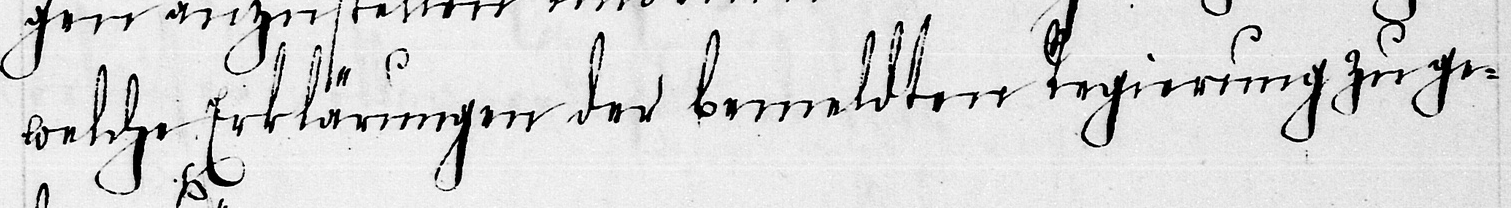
welche Erklärungen der bemeldten Regierung zu ge¬
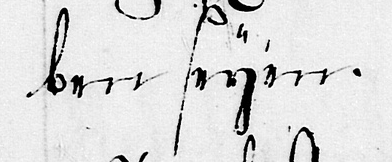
ben seyen.
